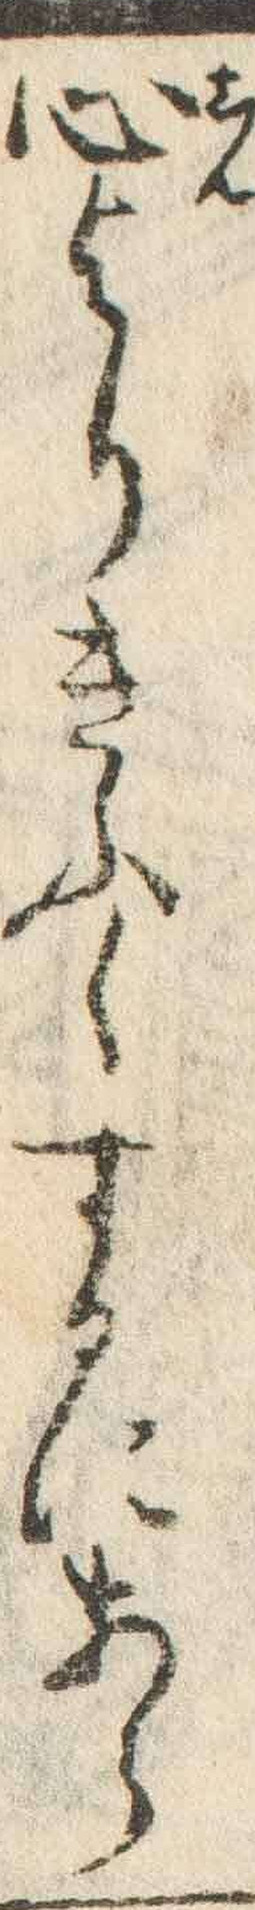心よりきふくするにあら
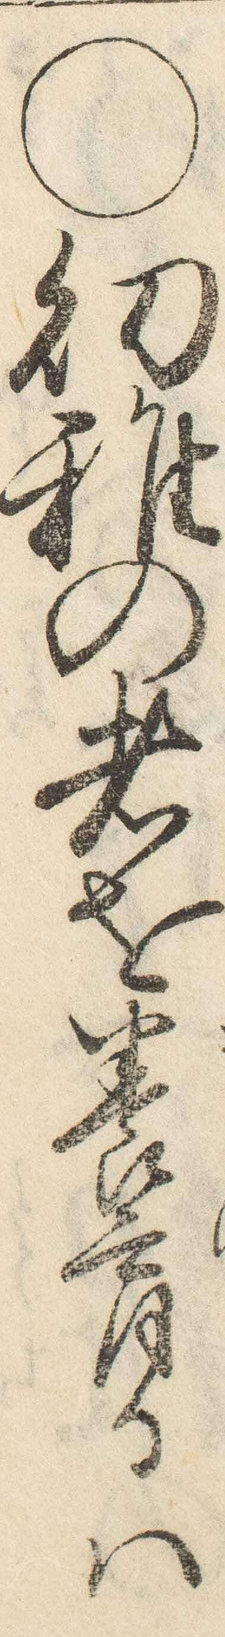〇幼稚の者を養育るは
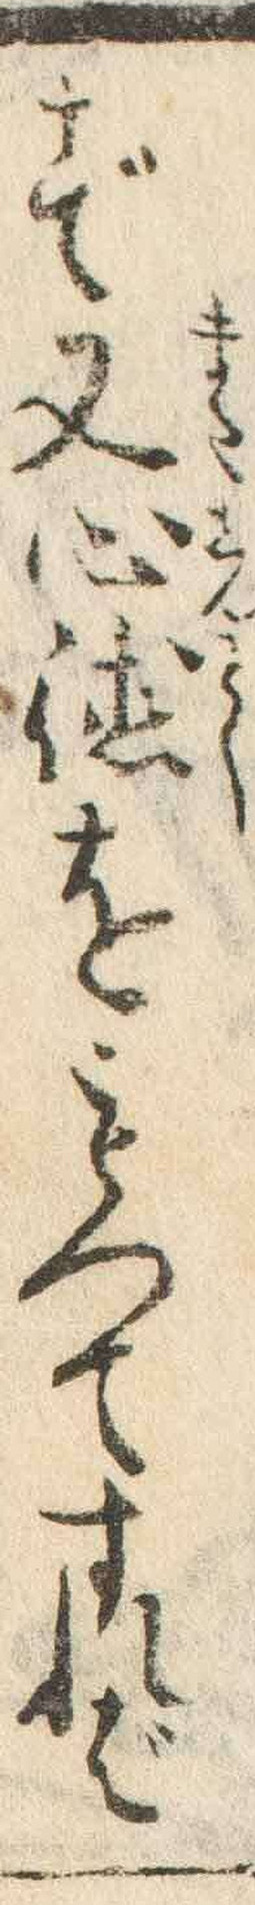ず又心徳をもつてすれば
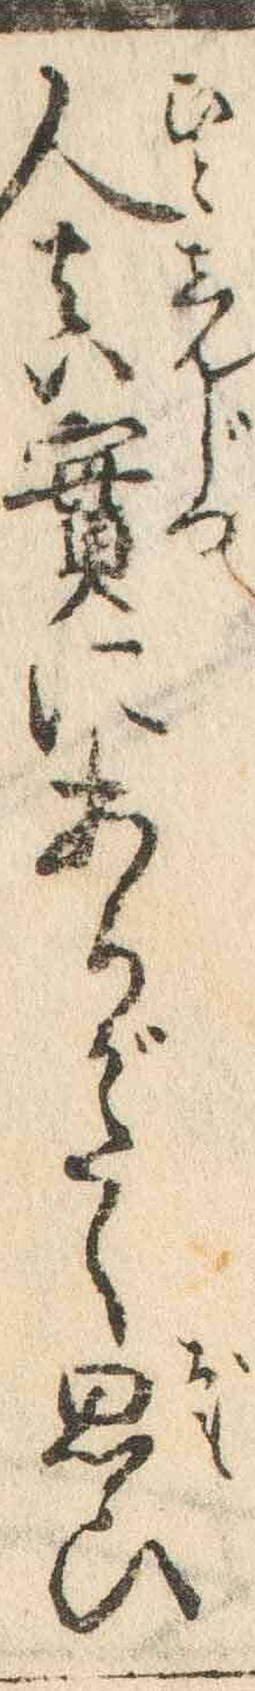人真実にありがたく思ひ
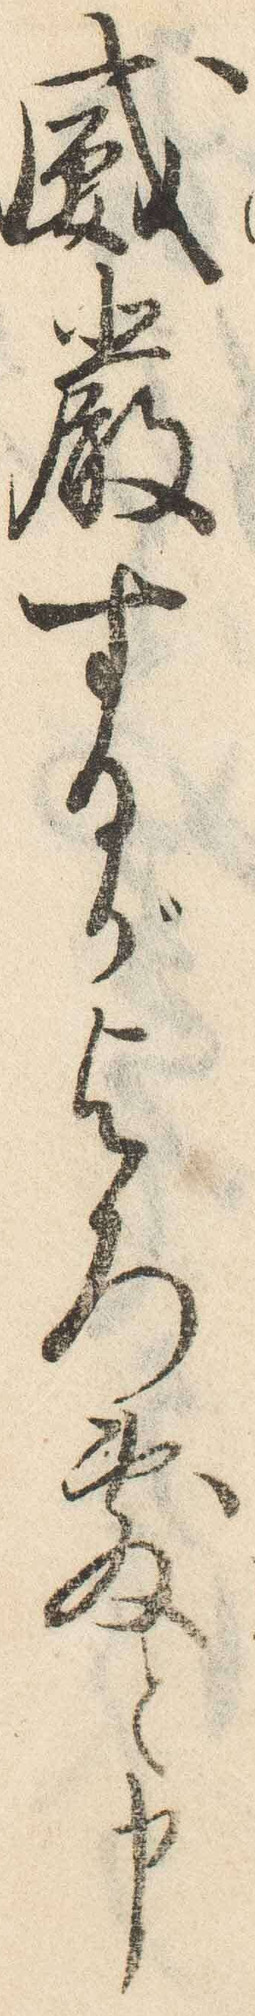威厳するがよろ敷と申
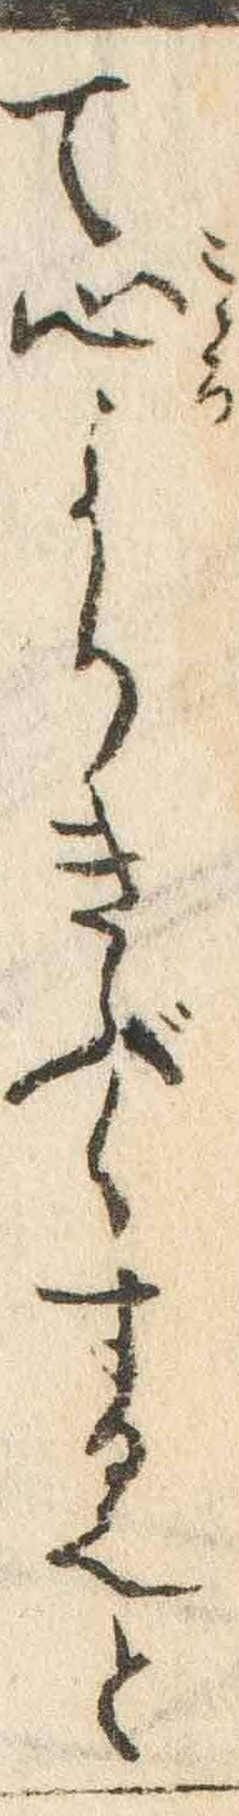て心よりきぶくする也と
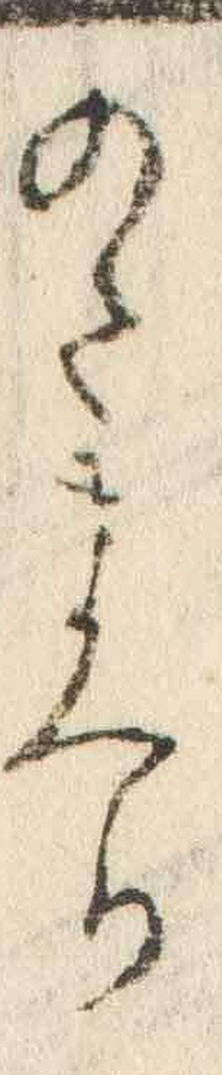のたまへり
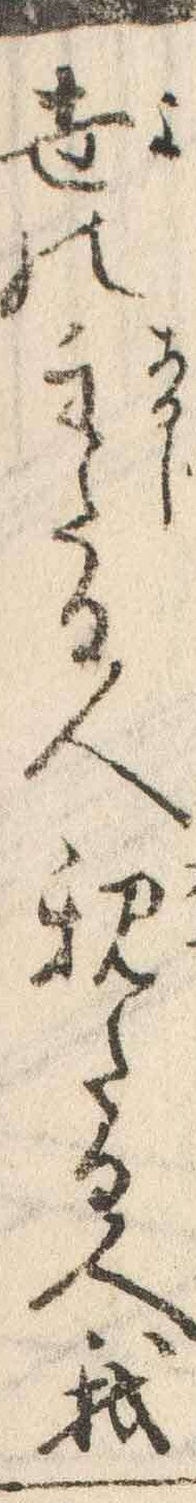世の主たる人親たる人我
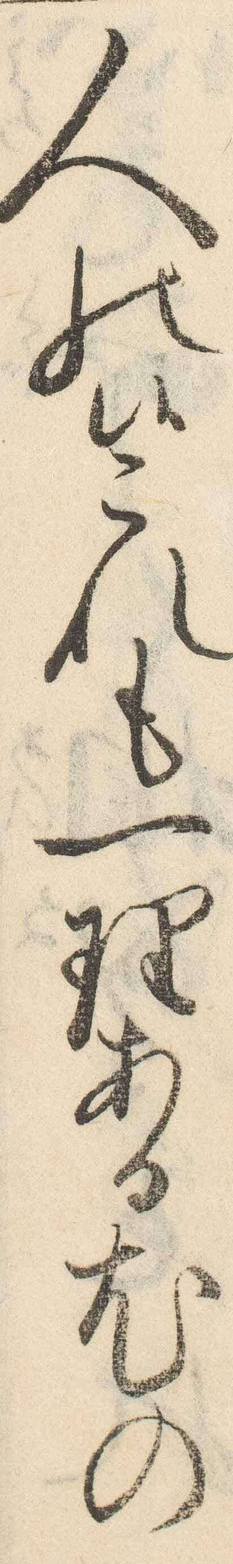人の候これも一理ある尤の
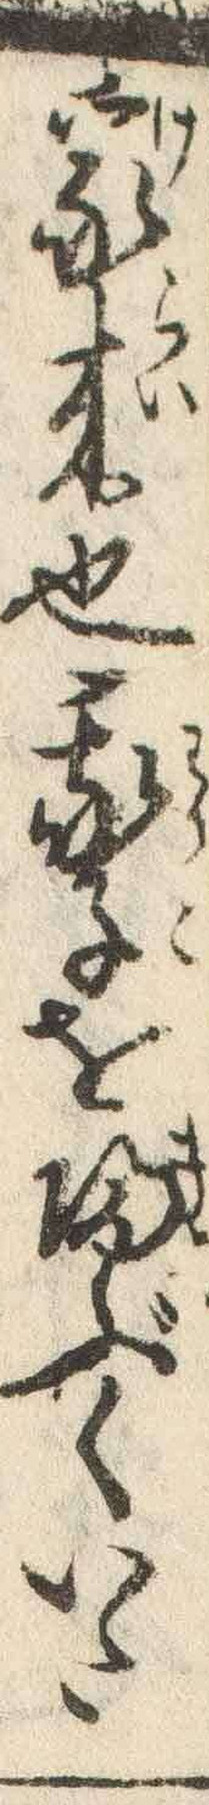家来や我子を帰ぶくいた
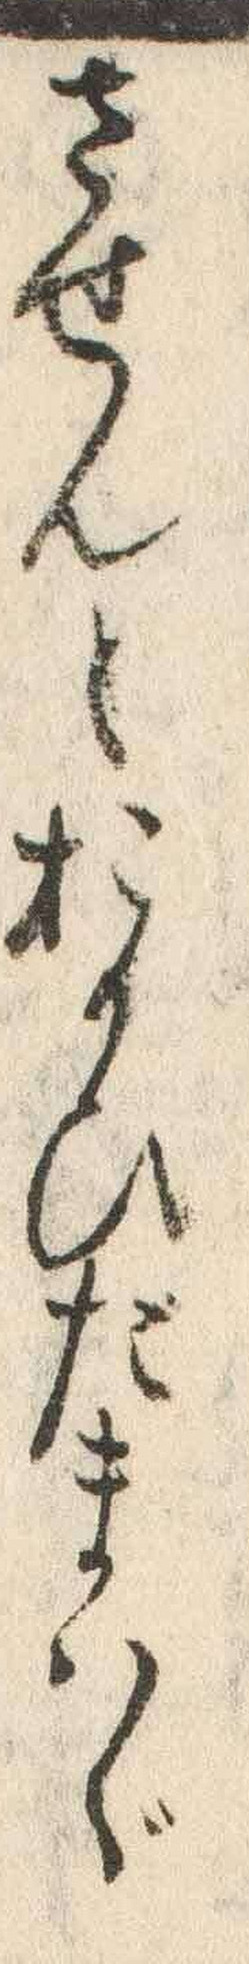させんとおもひたまはゞ
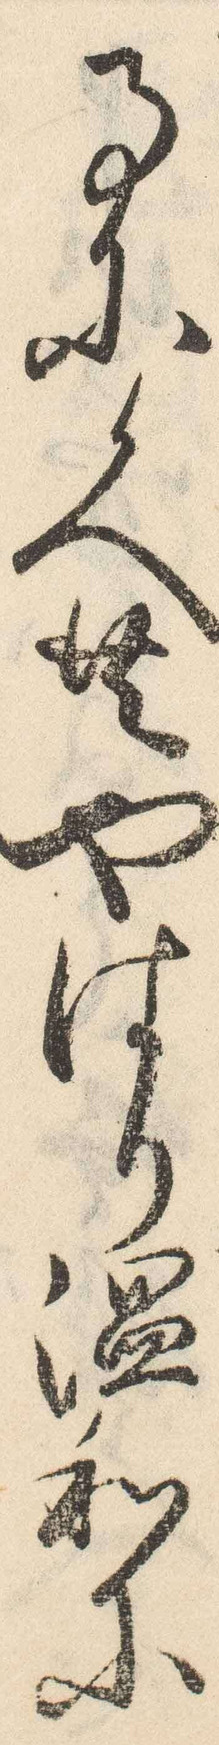事に候へ共やはり温和に
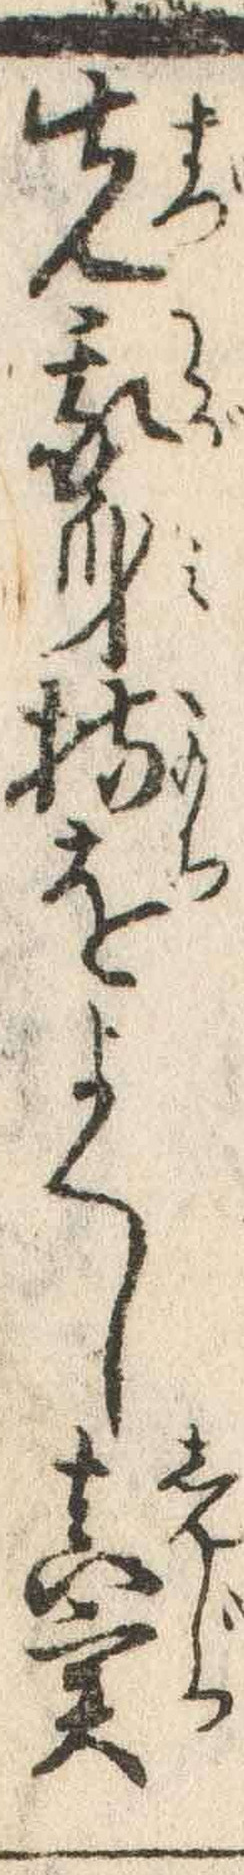先我身持をよくし真実
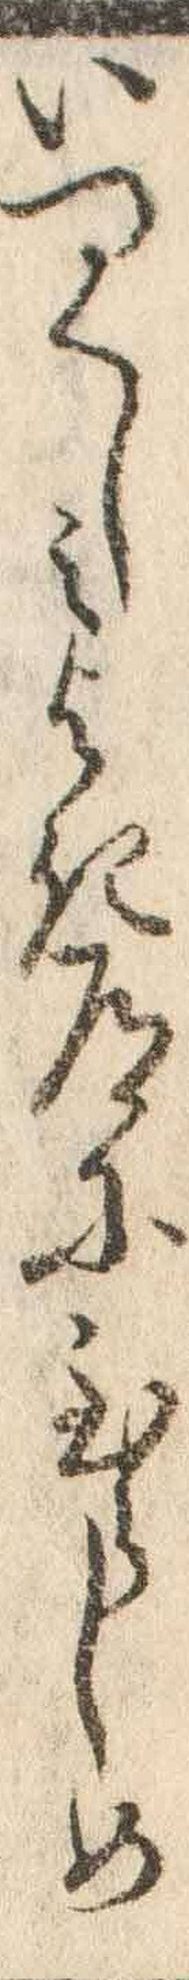いつくしみよき道に至らしめ
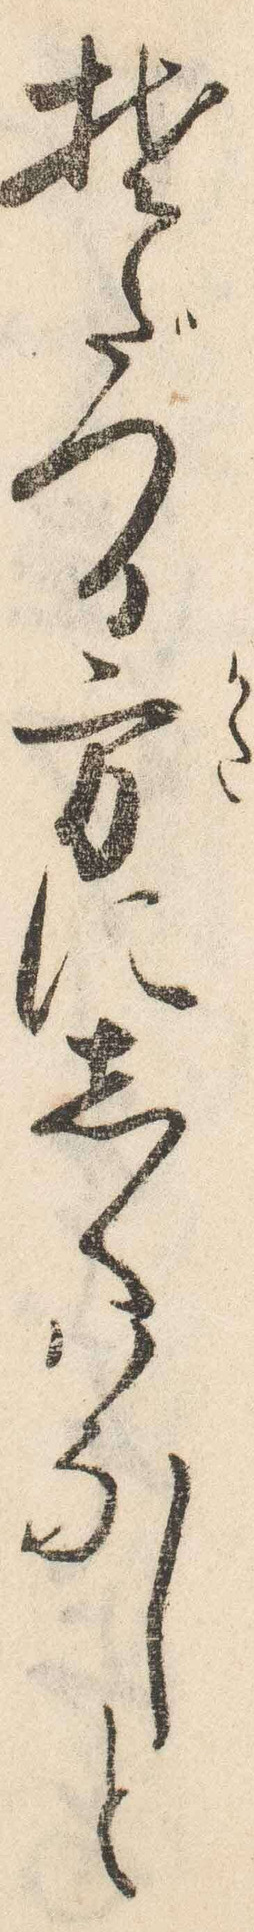そだつる方にしくはなしと
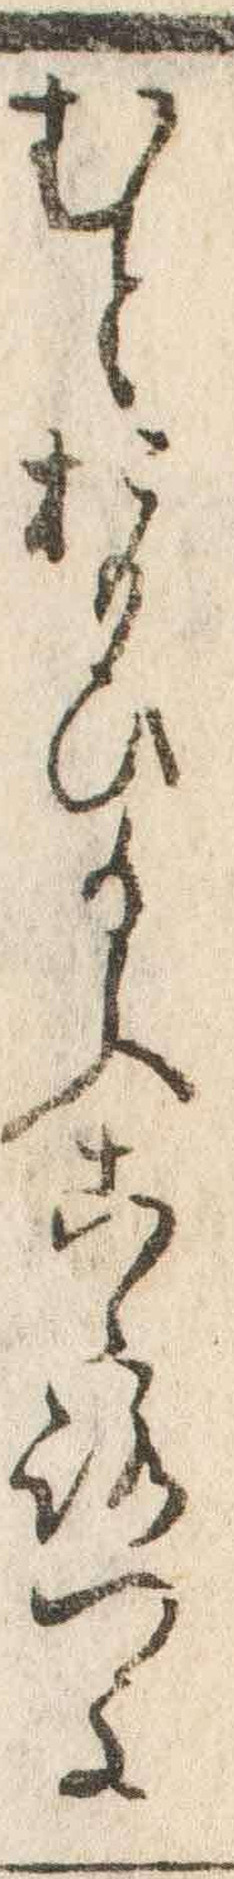むとおもひ給ふこゝろつよ
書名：撫育草
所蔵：東京学芸大学附属図書館 国文学研究資料館
